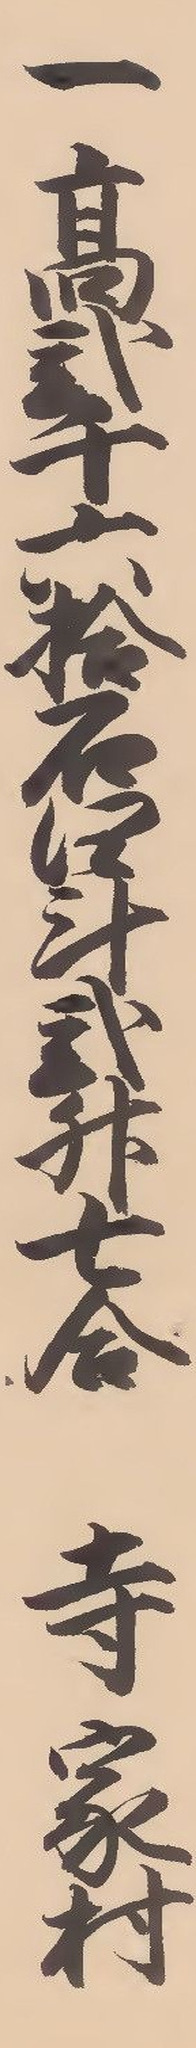一高弐千六拾石四斗弐升七合寺家村
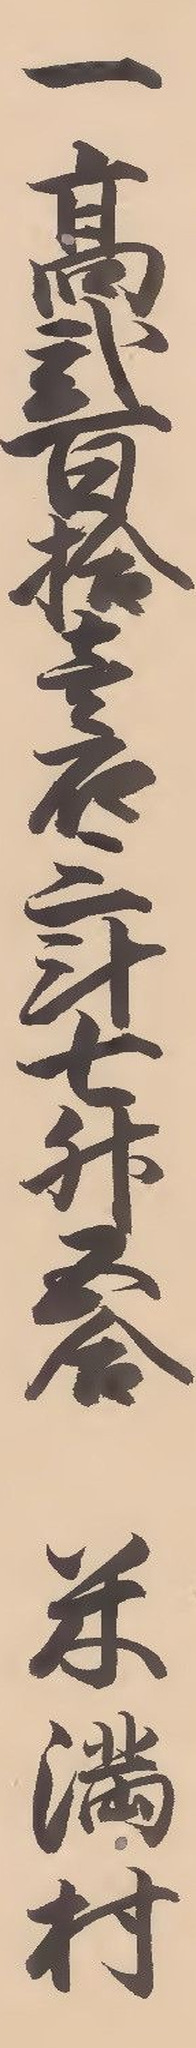一高弐百拾壱石三斗七升五合米満村
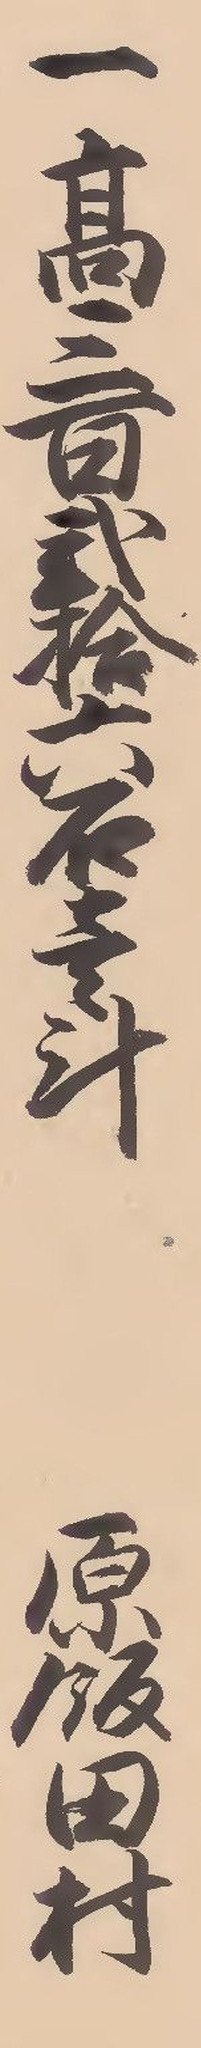一高三百弐拾六石壱斗原飯田村

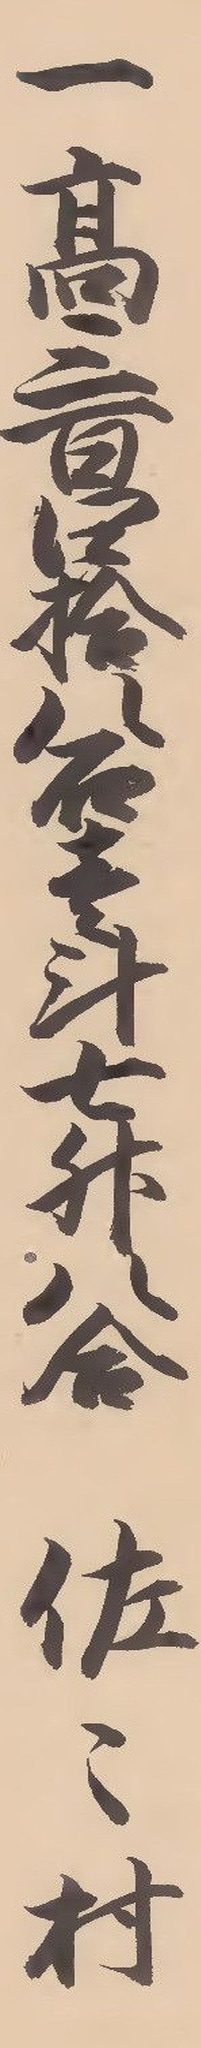一高三百四拾八石壱斗七升八合佐々村
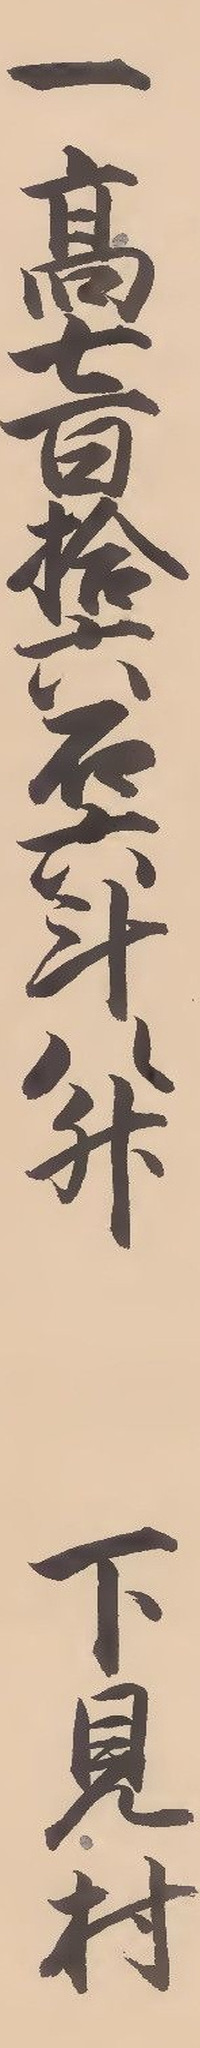一高七百拾六石六斗八升下見村
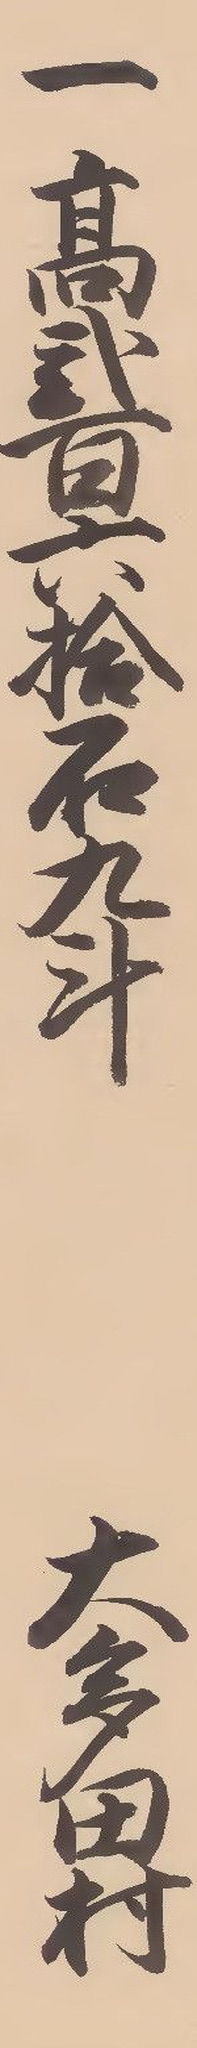一高弐百六拾石九斗大多田村
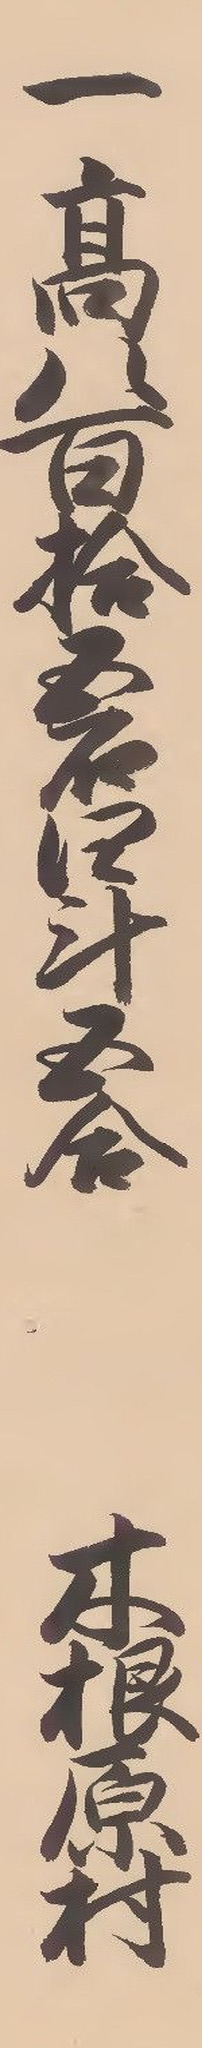一高八百拾五石四斗五合木根原村
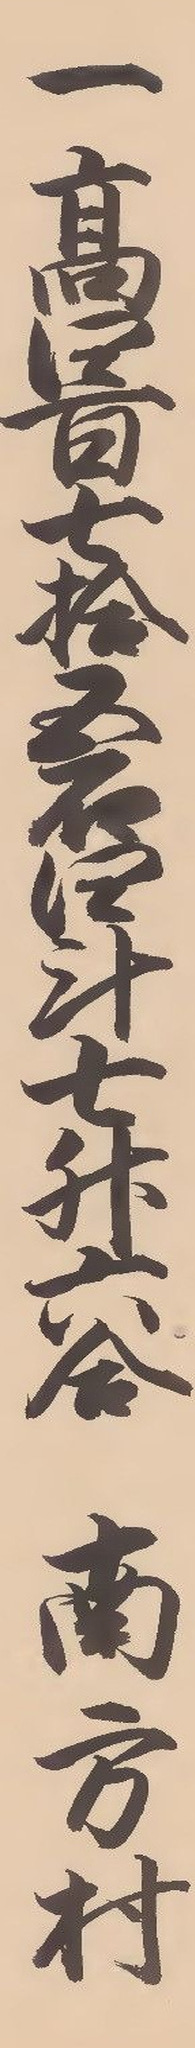一高四百七拾五石四斗七升六合南方村
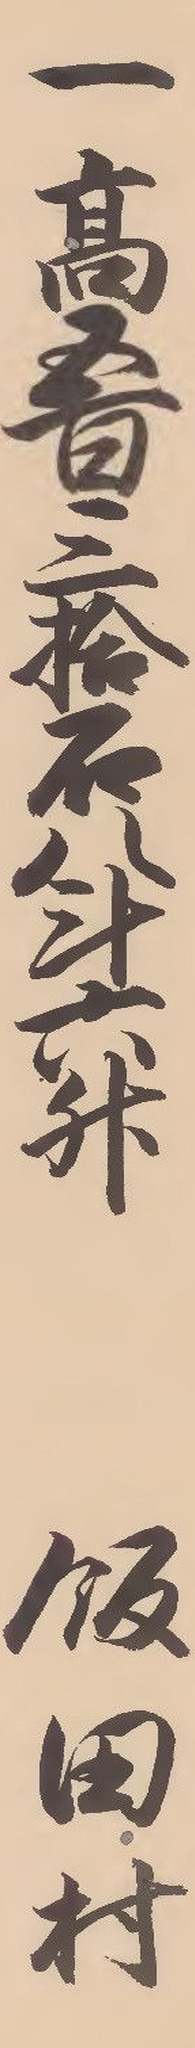一高五百三拾石八斗六升飯田村
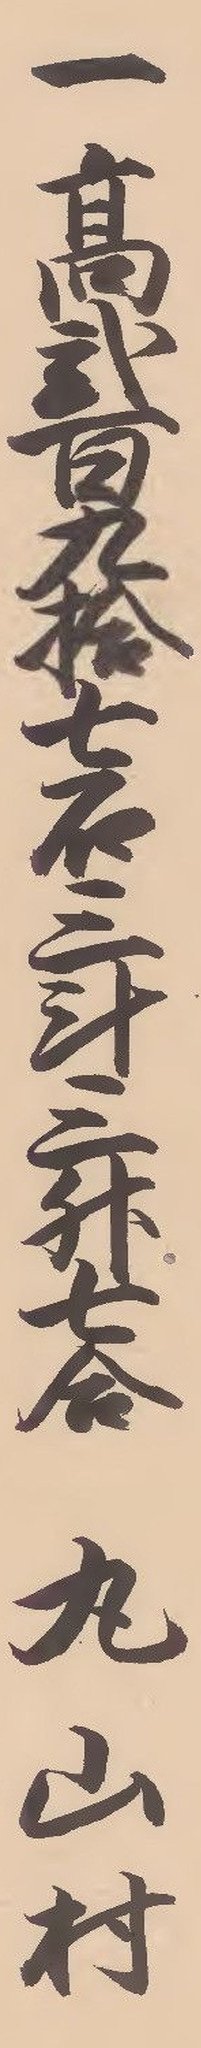一高弐百九拾七石三斗三升七合丸山村

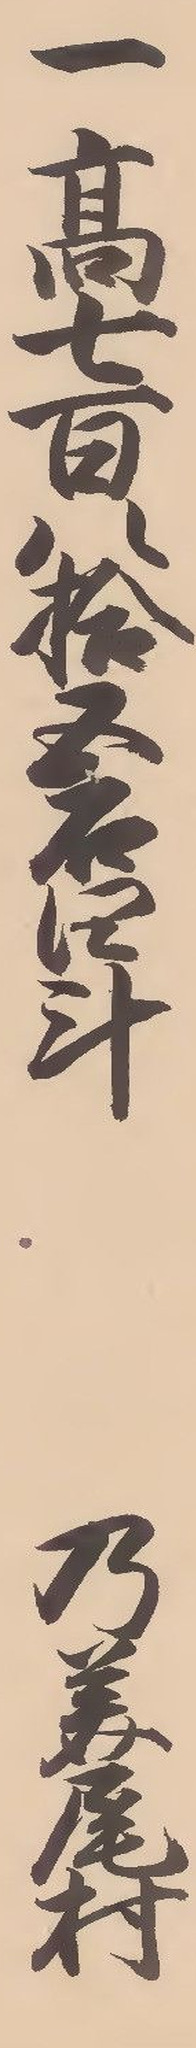一高七百八拾五石四斗乃美尾村
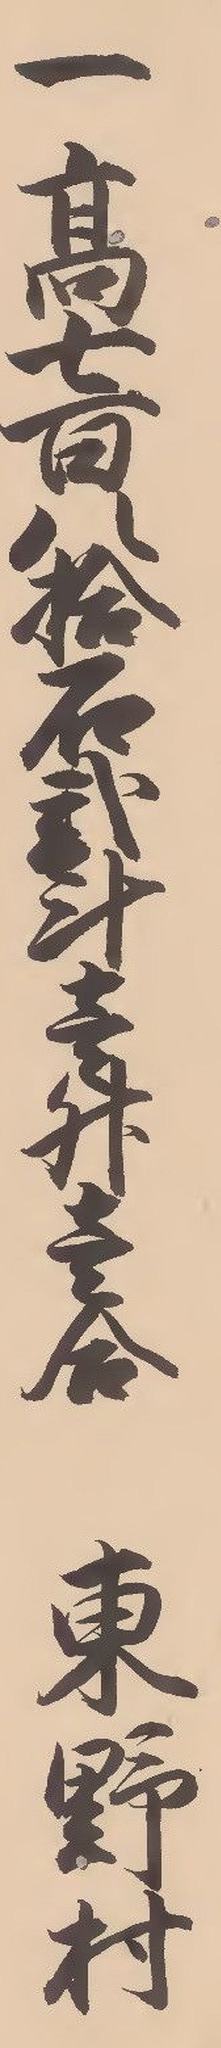一高七百八拾石弐斗壱升壱合東野村
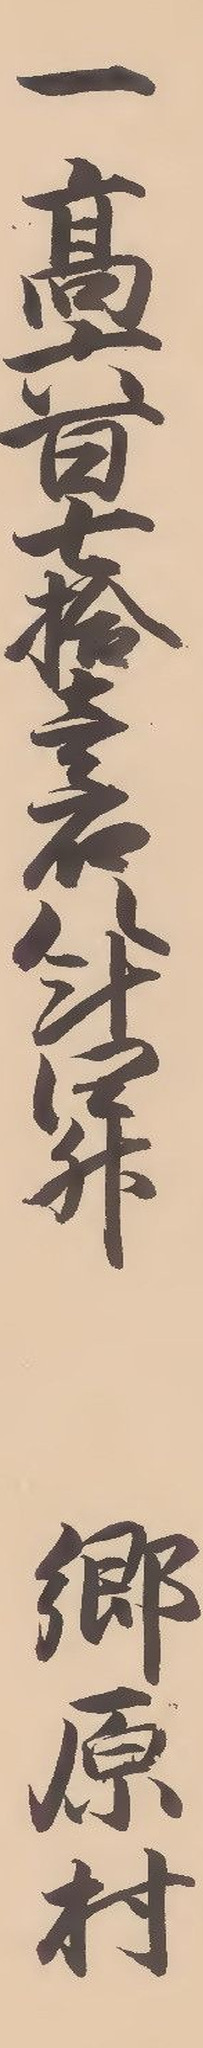一高六百七拾壱石八斗四升郷原村
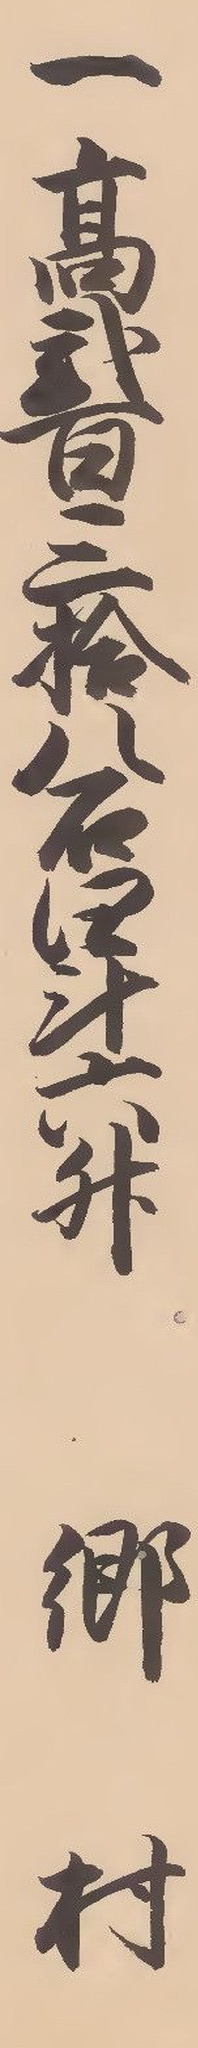一高弐百三拾八石四斗六升郷村
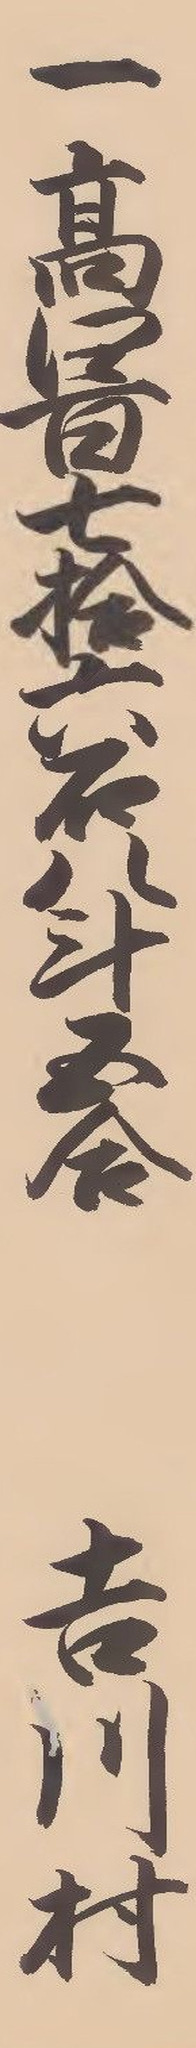一高四百七拾六石八斗五合吉川村
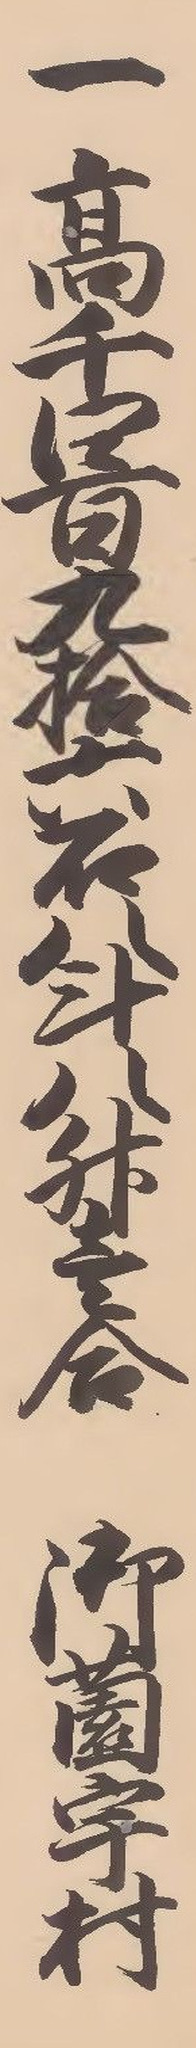一高千四百九拾六石八斗八升壱合御薗宇村
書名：安芸国郷帳
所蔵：国立公文書館 National Archives of Japan
